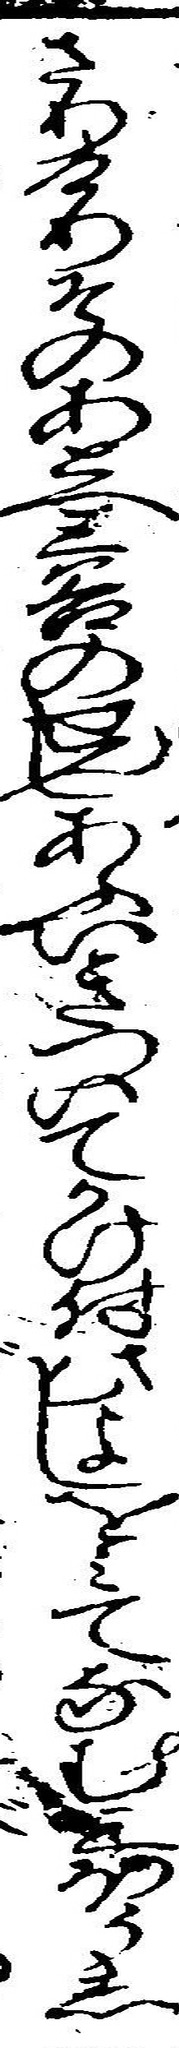さりけりそのあとへ三谷のせんしあふいきついてかけ付此よしをみてなむ三ほうし
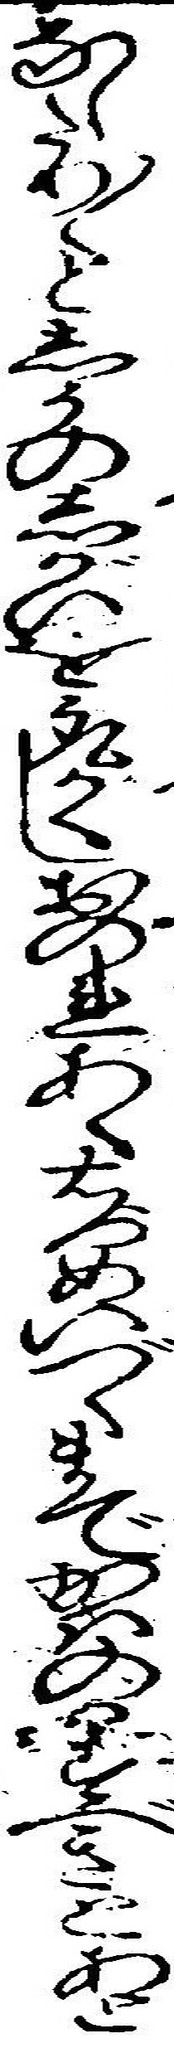なしたり〳〵としうのしがいを取かくしおのれあく右衛門めいづくまでかはのすべきとあと
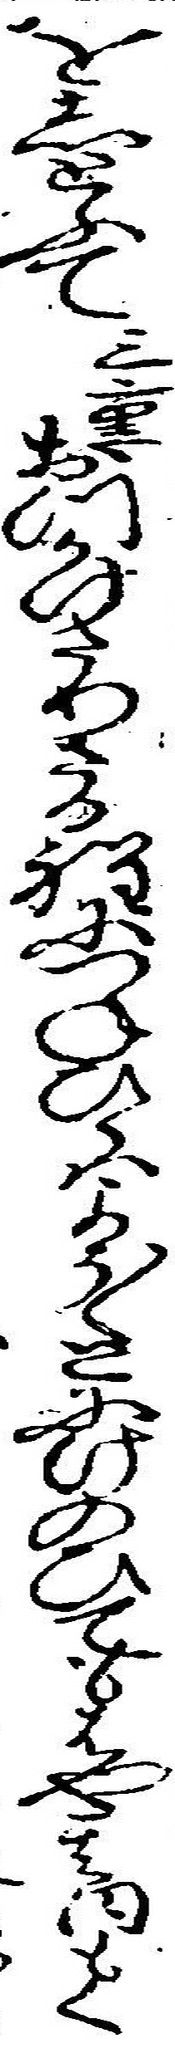をしとふて三重おつかけたりさる程につねひらはよう〳〵とにけのひてもはや其日もく
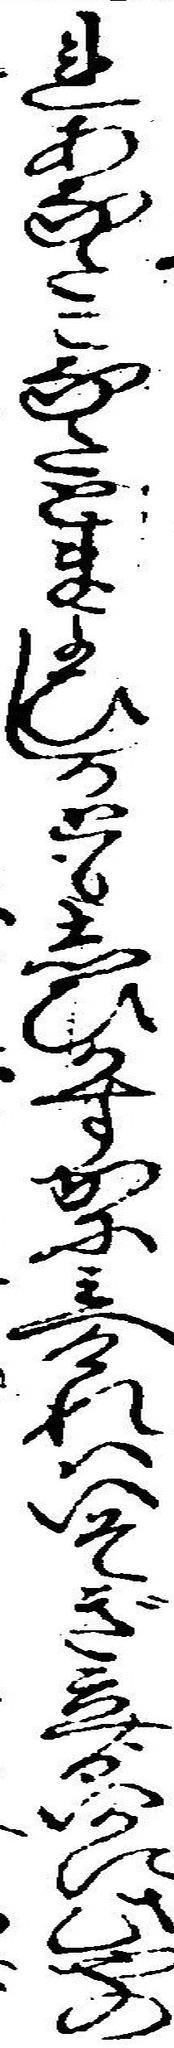れあなたこなたとまよひしかともしひかすかにみへけれはいそぎ立ゟいかに此やの
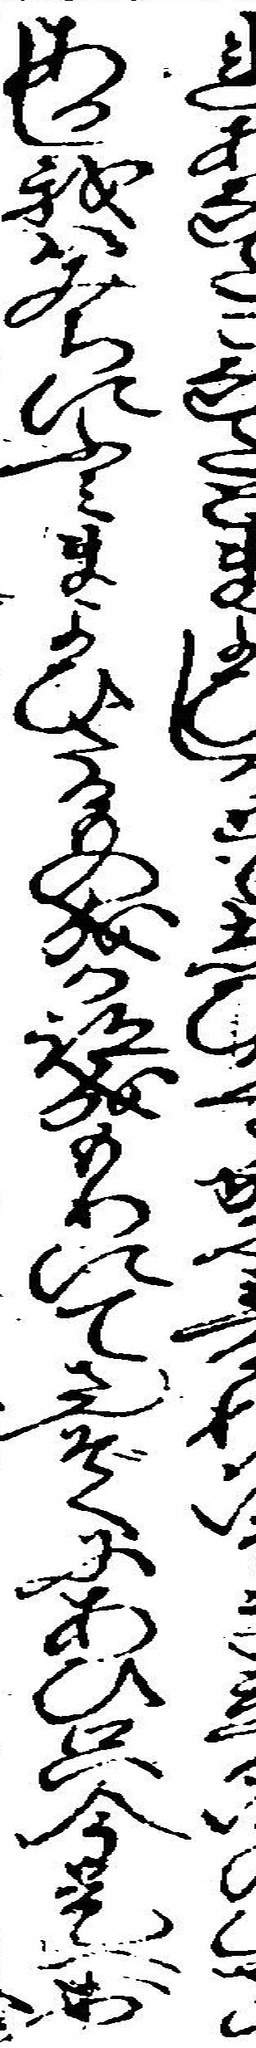あるし我はみちにふみまよひたるもの成か跡成もりにてさんぞくにあひ只今是へお
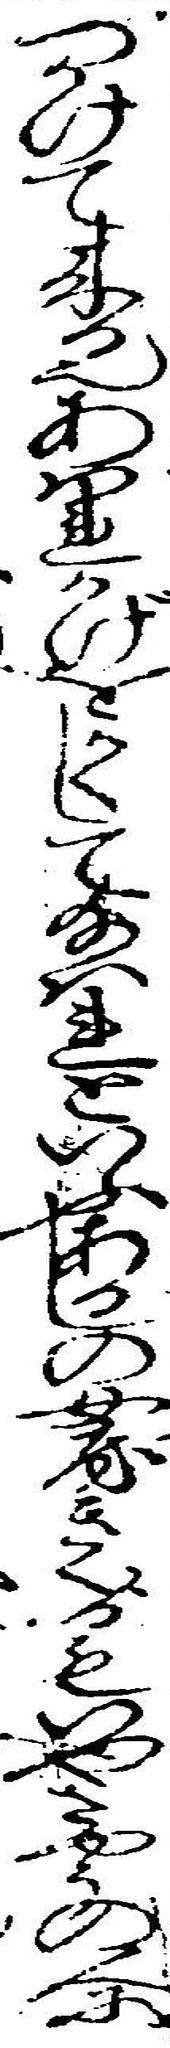つかけて来る也あはれかげをかくして給はれといふあるしの女房きくゟもいやさやうの人に
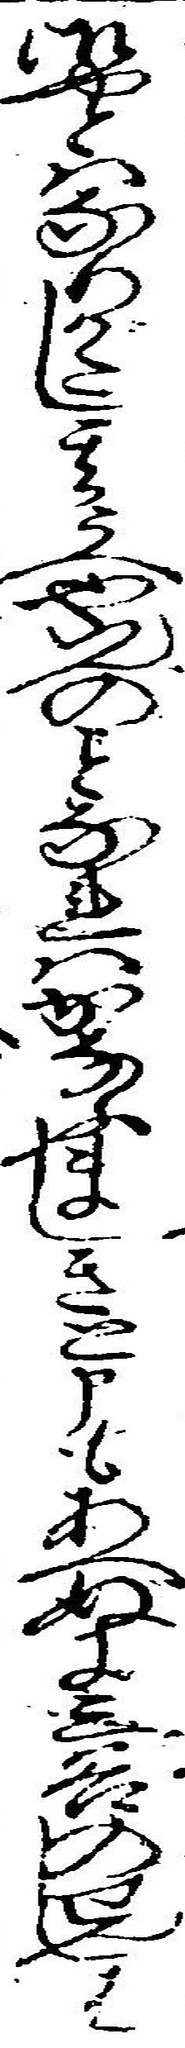御やとはなりがたし其うへやいんのことなれはかなふましきと申もあへぬに三谷のせんしは
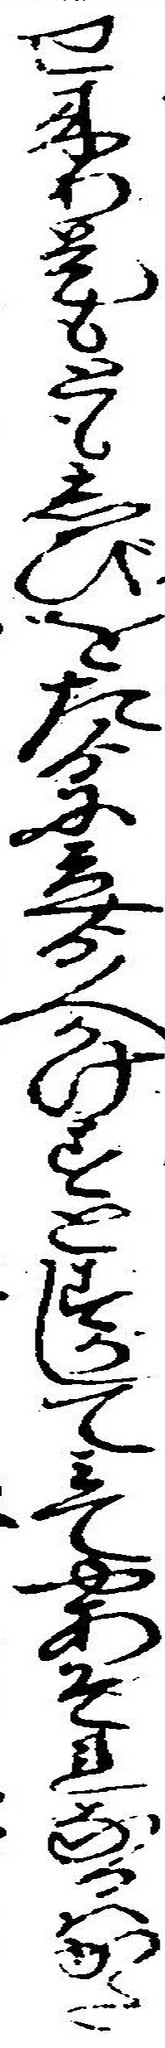せ来り是もともしびをたゟに立ゟ人かけすとすかしてみてやあそれなるはかた
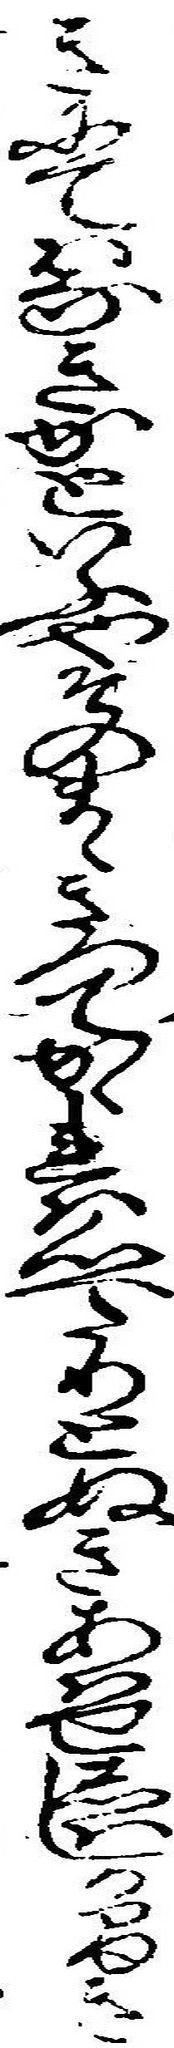きにてはなきかといふやそのまゝきつてかゝれは心へたりとぬきあはせしはしか間き
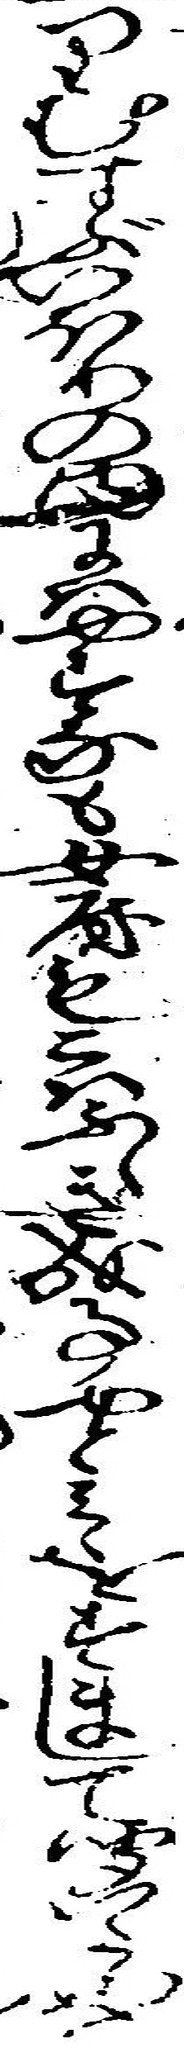りむすぶいほりの内にはやすなも女房もこはふしき成事やとみゝをすまして聞いたり
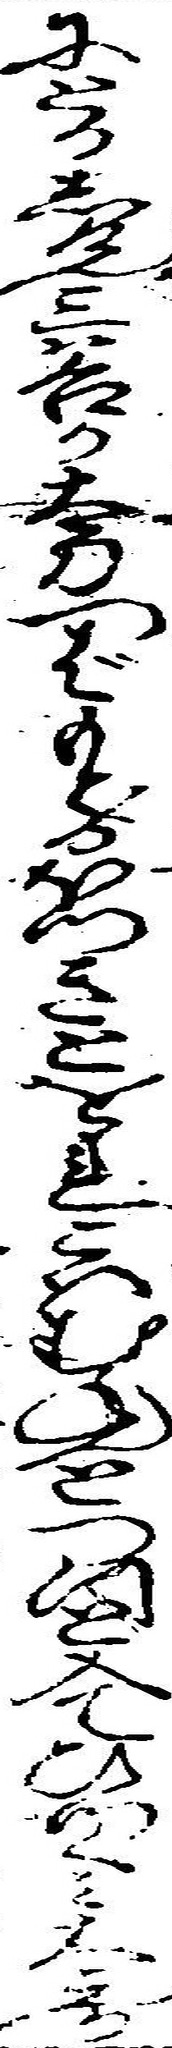にとるしけん三谷か太刀つばもとゟほつきとをれこはむねんとつつと入てひつくみ大こんか
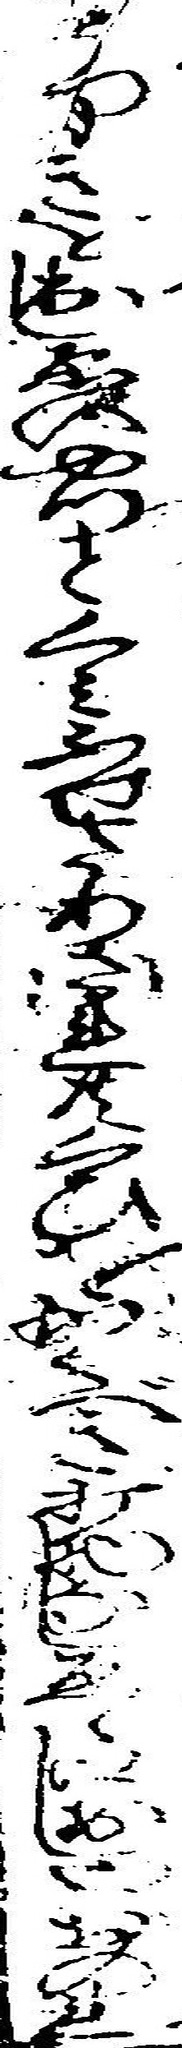うりきを出しゑいやつとくみふせたりされ共くひをかくべき打物なしゑゝ口おしやおのれ
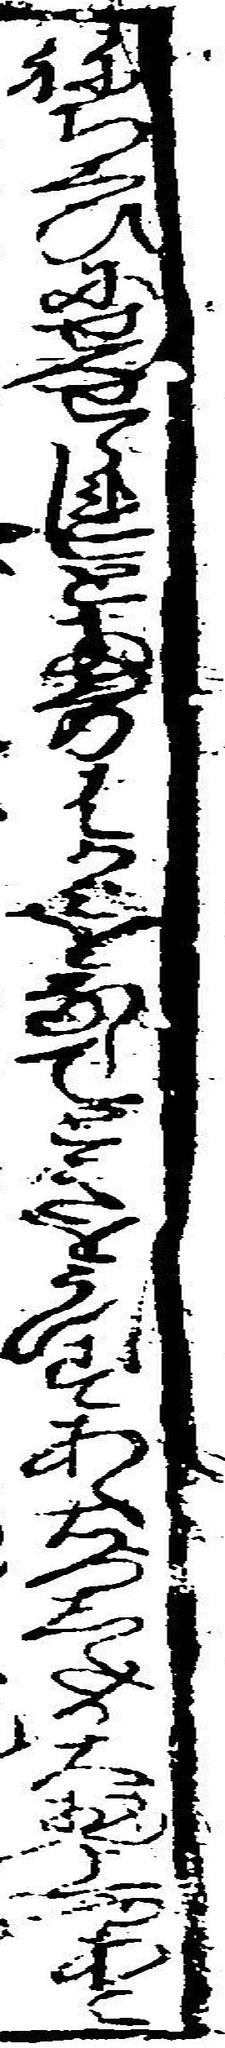ねちくひにせんせられしと両方はかみをなしてときをうつすあく右衛門したゟ大おん上やあこ
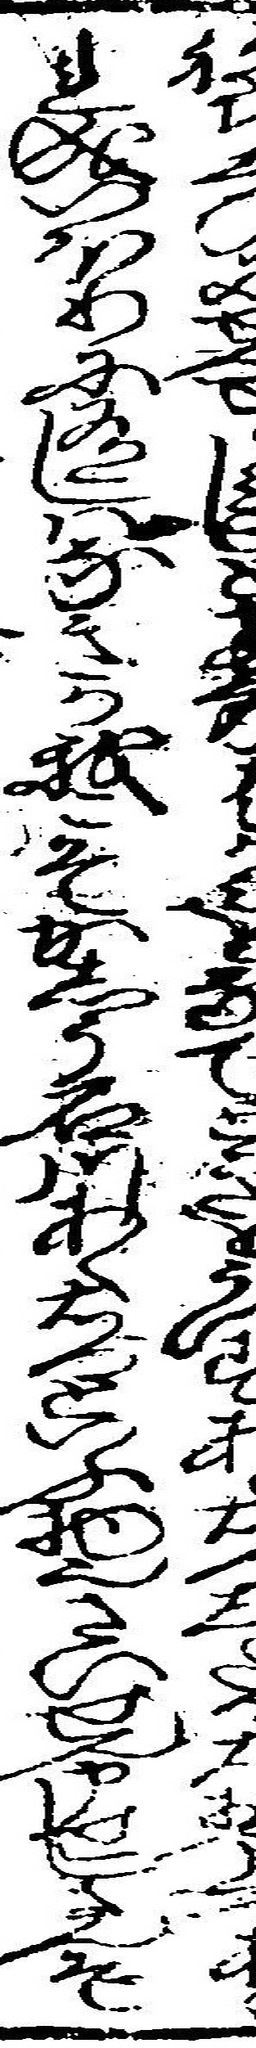れ成いほりに有しはなきか我こそかしう石川あく右衛門といふ物也さいせん申せしさんぞ
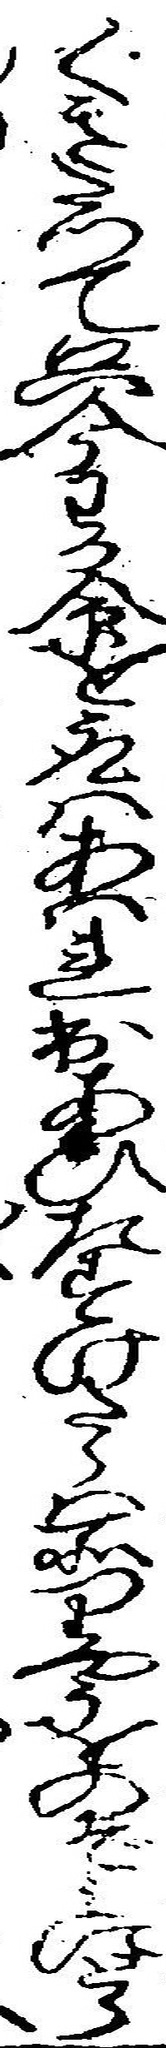くきたつて只今わか命を取はあはれ出あひたすけたらは所りやうをのぞみににとら
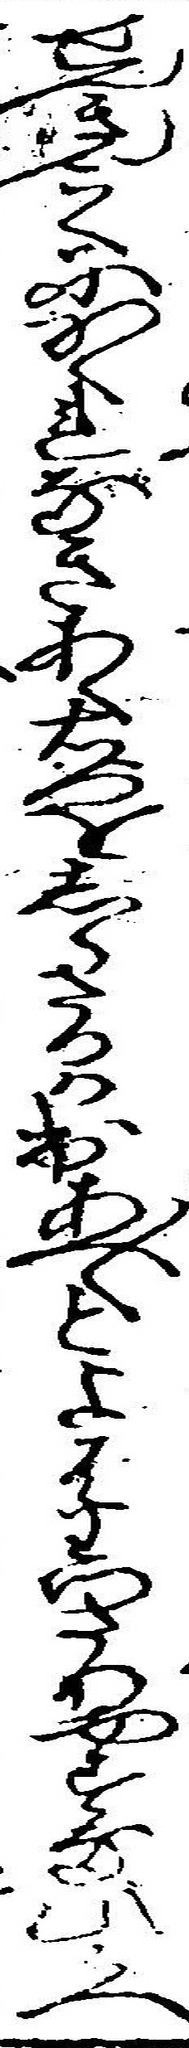せんきんこくにかくれなきあく右衛門をしらさるか出あへ〳〵とよはわつたりやすな此うへ
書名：[しのだづまつりぎつね付あべの清明出生]
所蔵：東京大学総合図書館 General Library in the University of Tokyo, JAPAN
